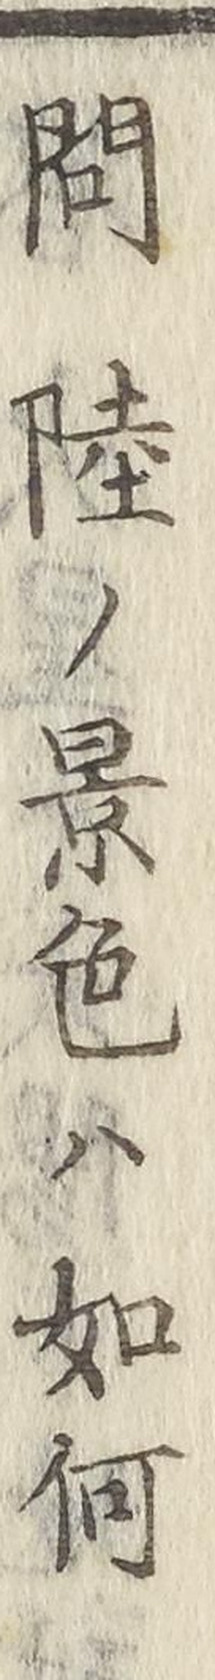問陸ノ景色ハ如何
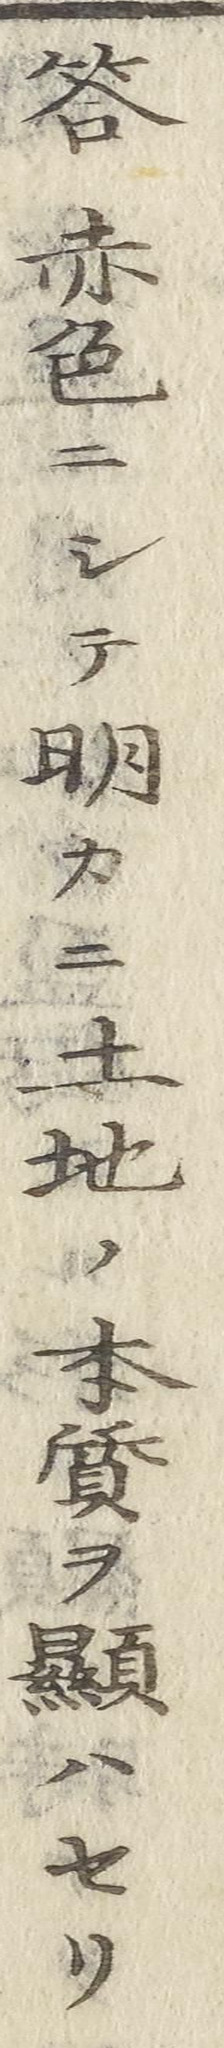答赤色ニシテ明カニ土地ノ本質ヲ顕ハセリ
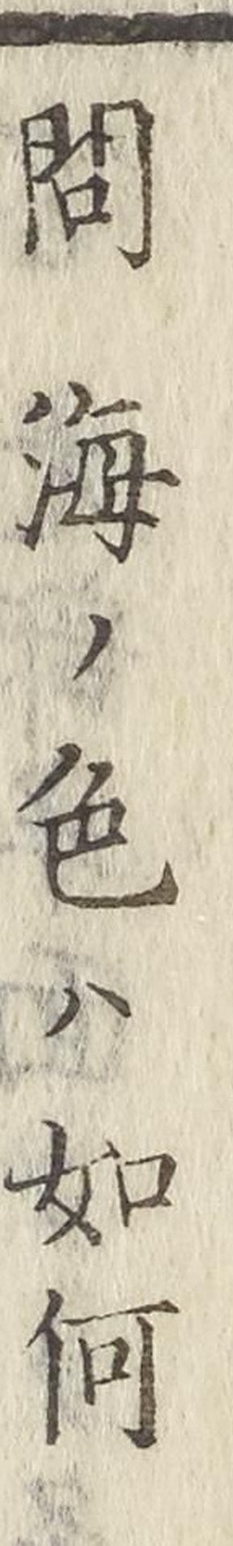問海ノ色ハ如何
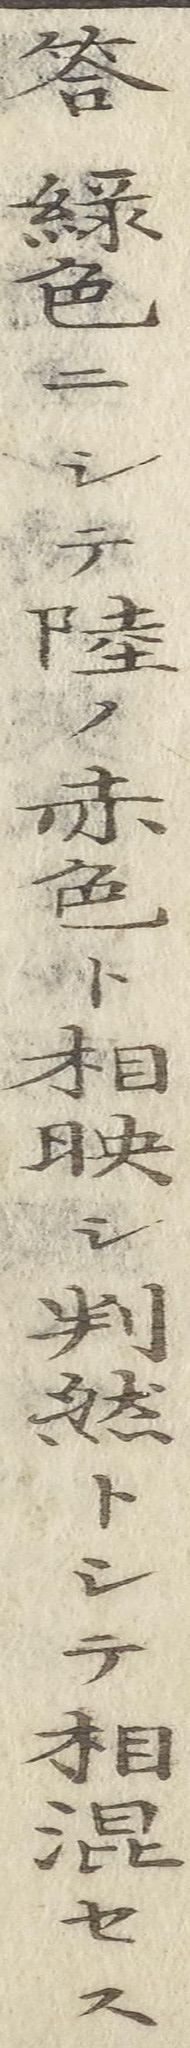答緑色ニシテ陸ノ赤色ト相映シ判然トシテ相混セス
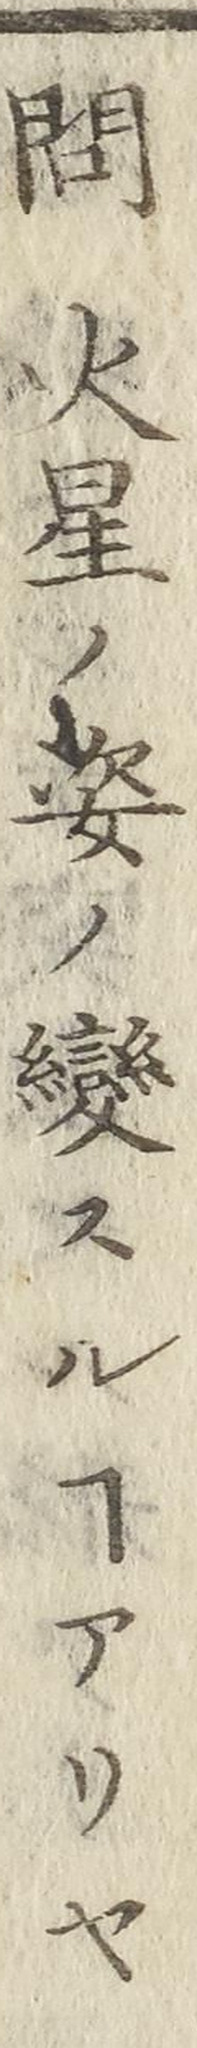問火星ノ姿ノ変スルコトアリヤ

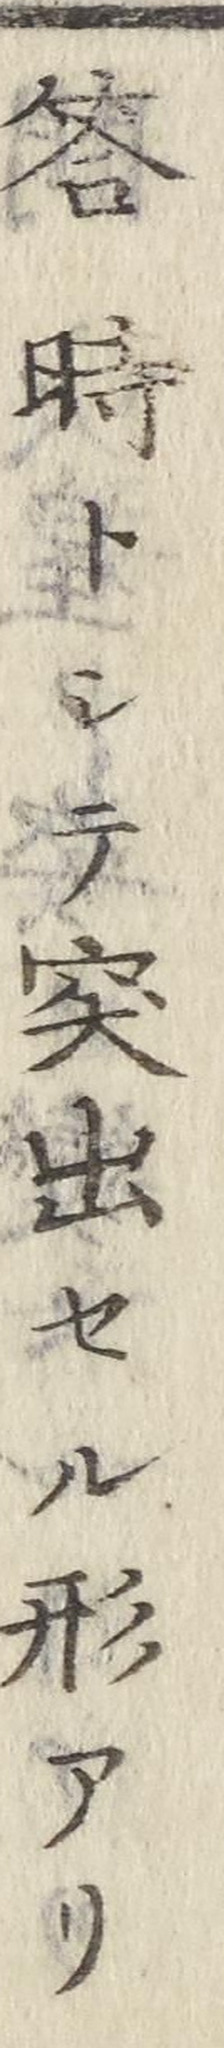答時トシテ突出セル形アリ
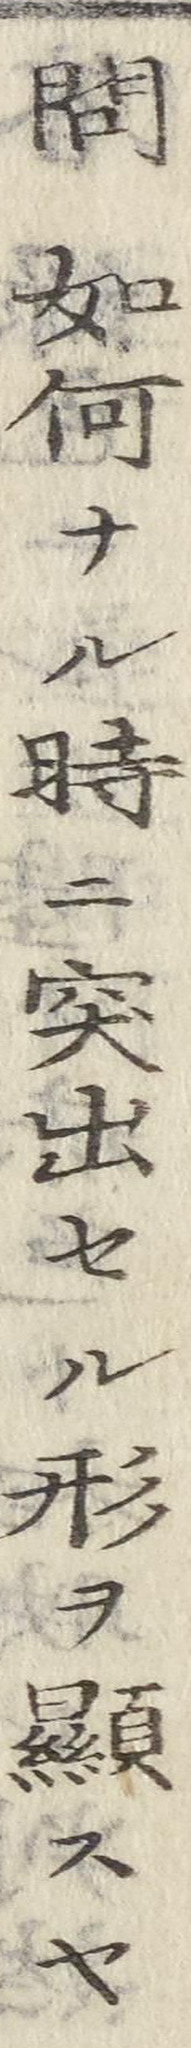問如何ナル時二突出セル形ヲ顕スヤ
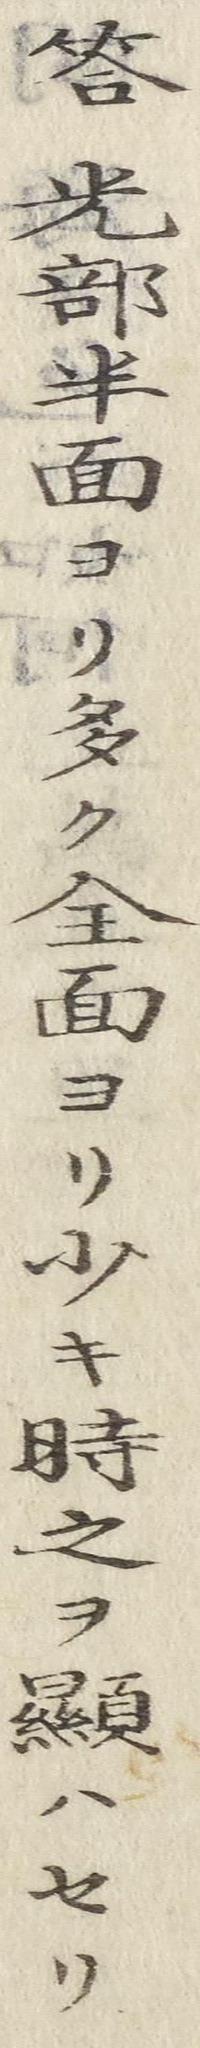答光部半面ヨリ多ク全面ヨリ少キ時之ヲ顕ハセリ
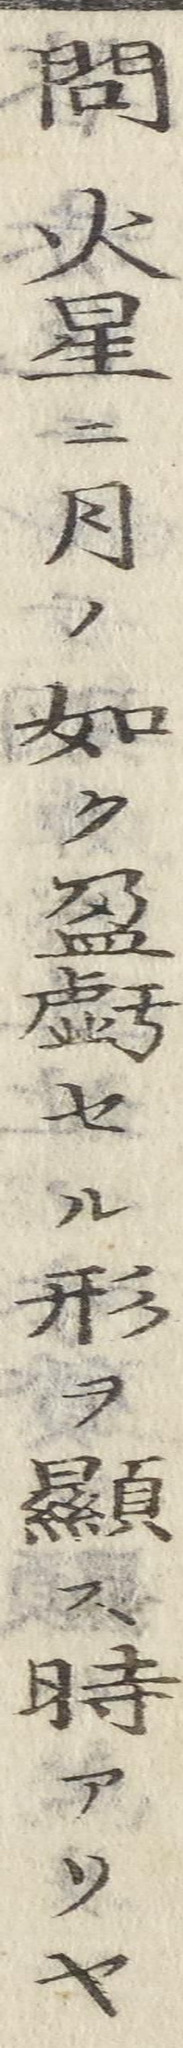問火星ニ月ノ如ク盈虧セル形ヲ顕ス時アリヤ
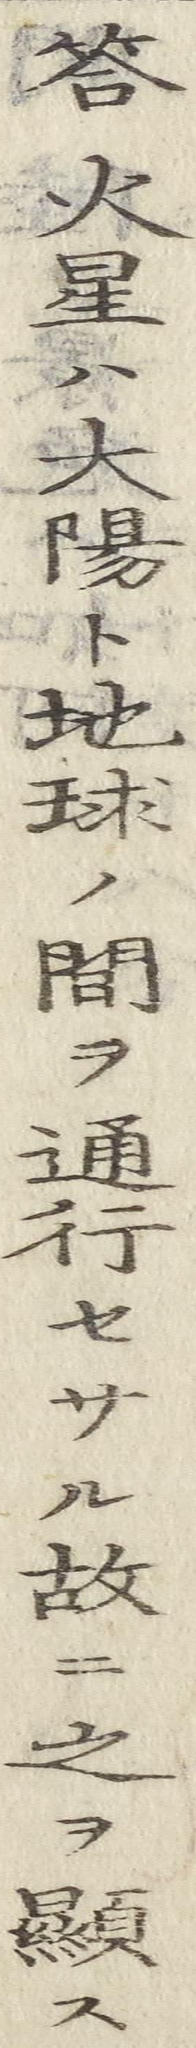答火星ハ大陽ト地球ノ間ヲ通行せサル故ニ之ヲ顕ス
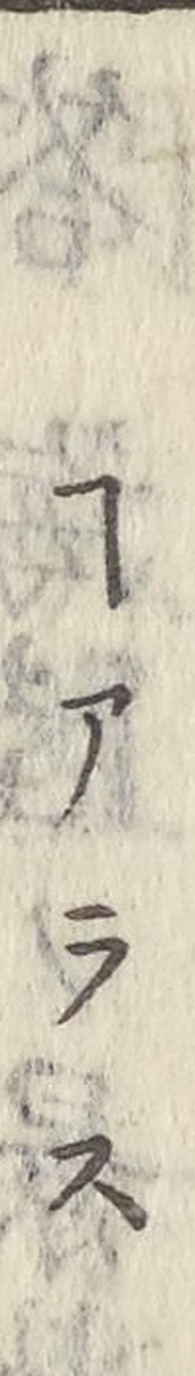コトアラス
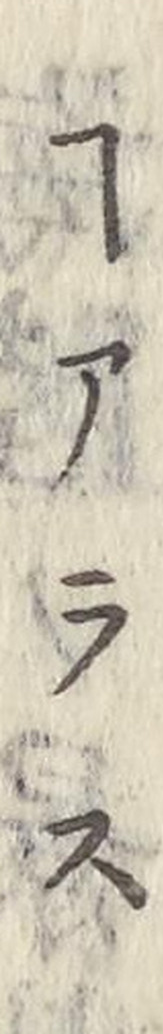コトアラス
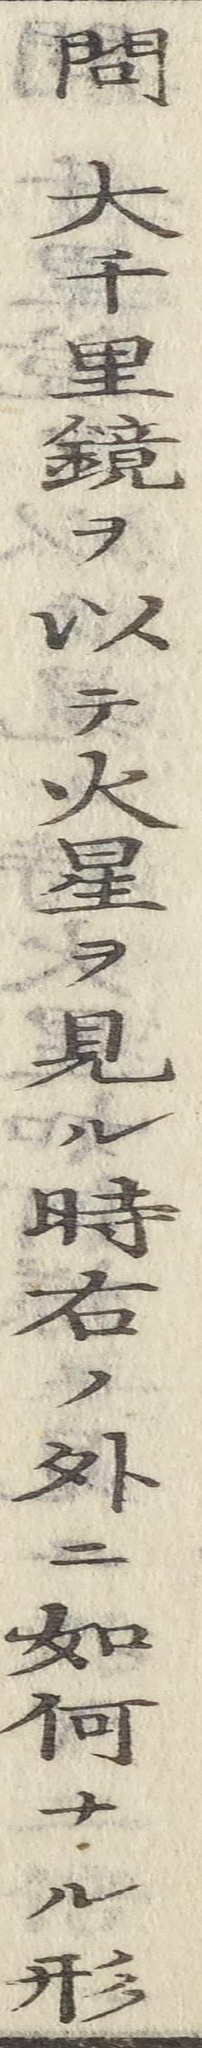問大千里鏡ヲ以テ火星ヲ見ル時右ノ外ニ如何ナル形
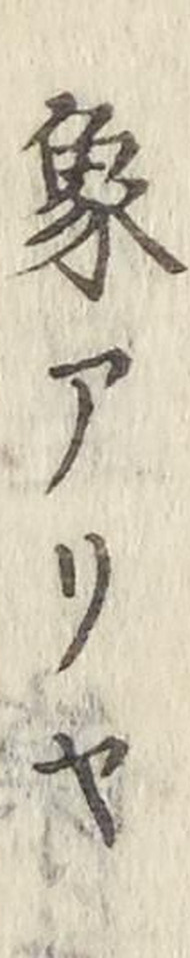象アリヤ
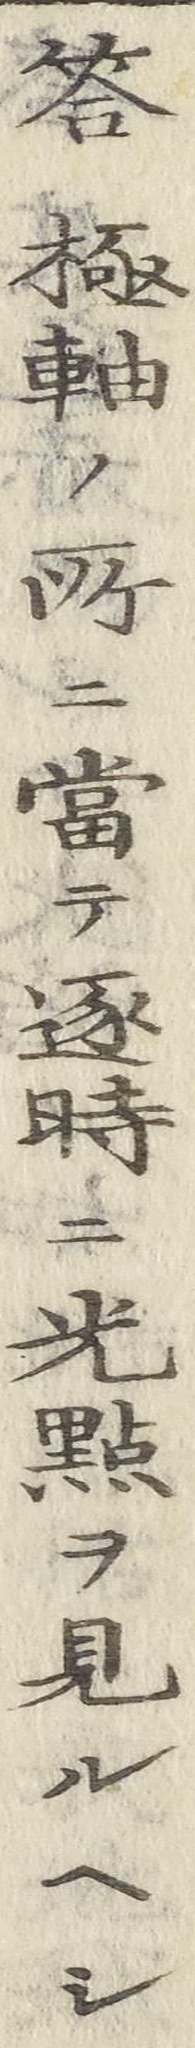答極軸ノ所ニ当テ逐時二光点ヲ見ルヘシ
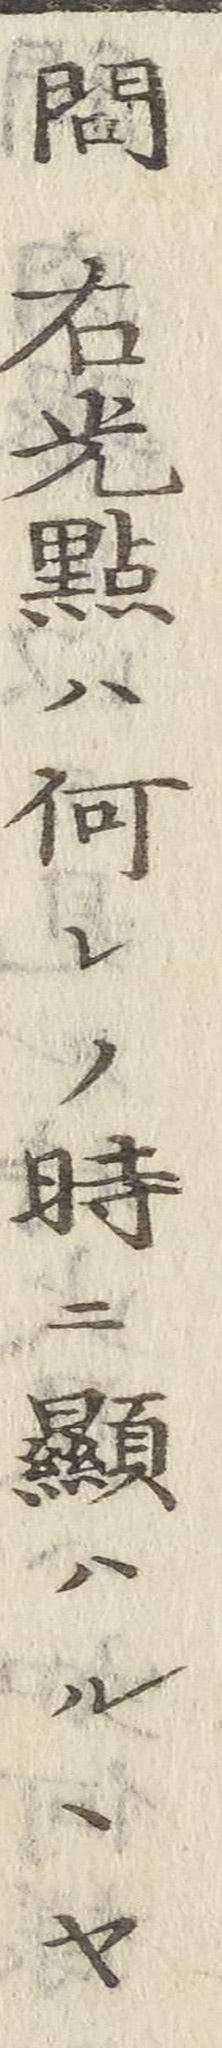問右光点ハ何レノ時二顕ハルゝヤ
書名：星学圖説　上
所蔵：東京大学地震研究所図書室 Earthquake Research Institute Library, The University of Tokyo, JAPAN
